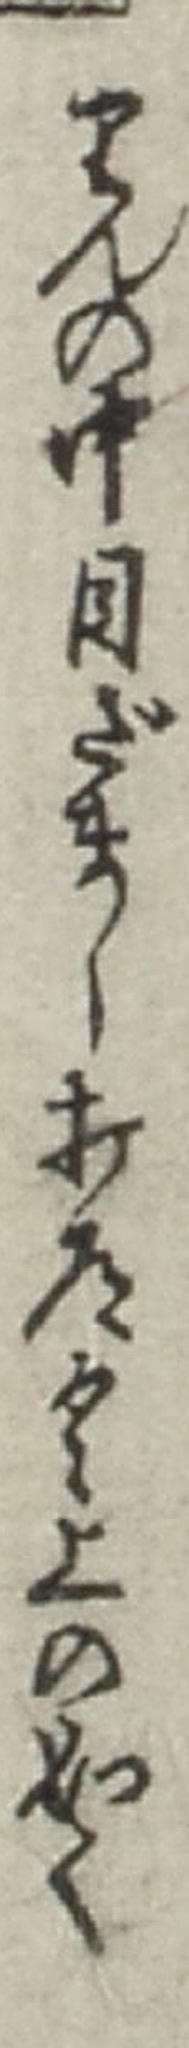りんの中目ざまし打道具上の如く
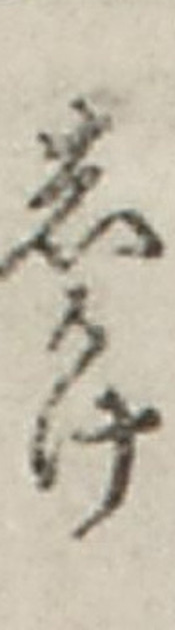しかけ
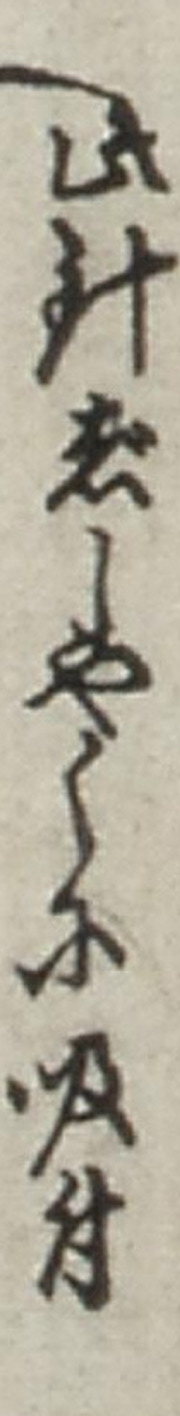車此針じしやくに吸付
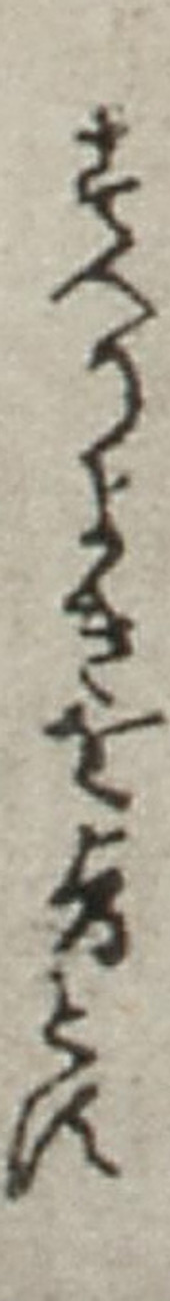すへりよきを旨とす
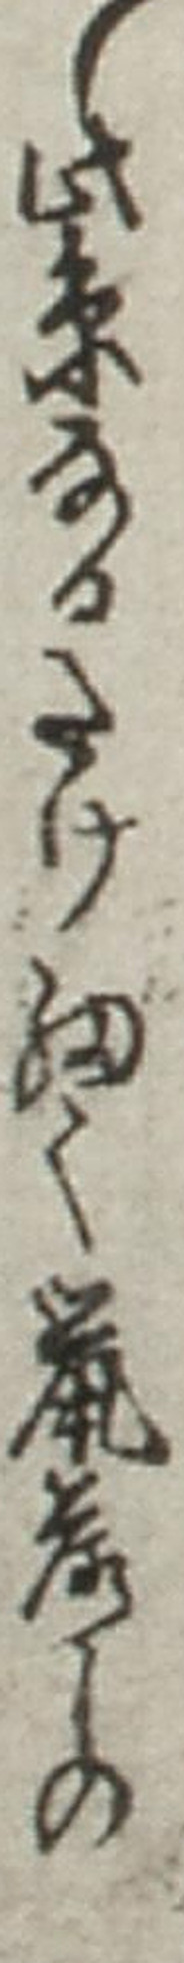此糸なるたけ細く鼠落しの
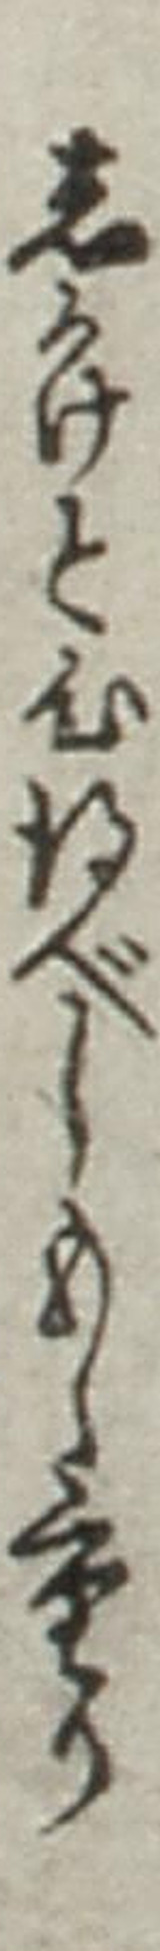糸車しかけと心得べしもし重り
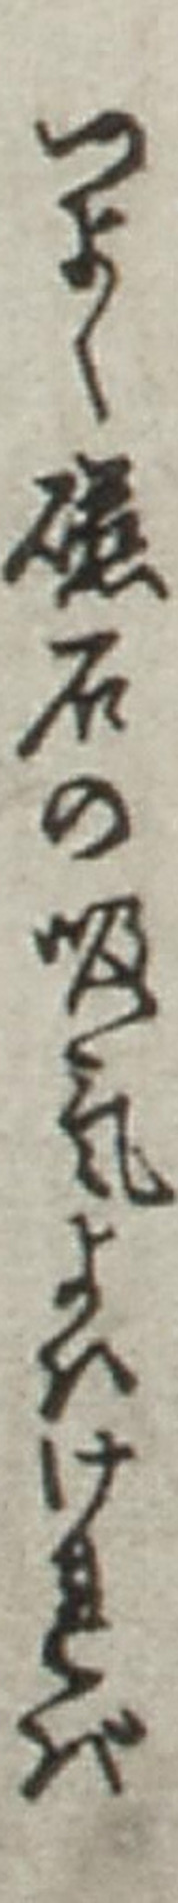糸巻つよく磁石の吸気よはければ
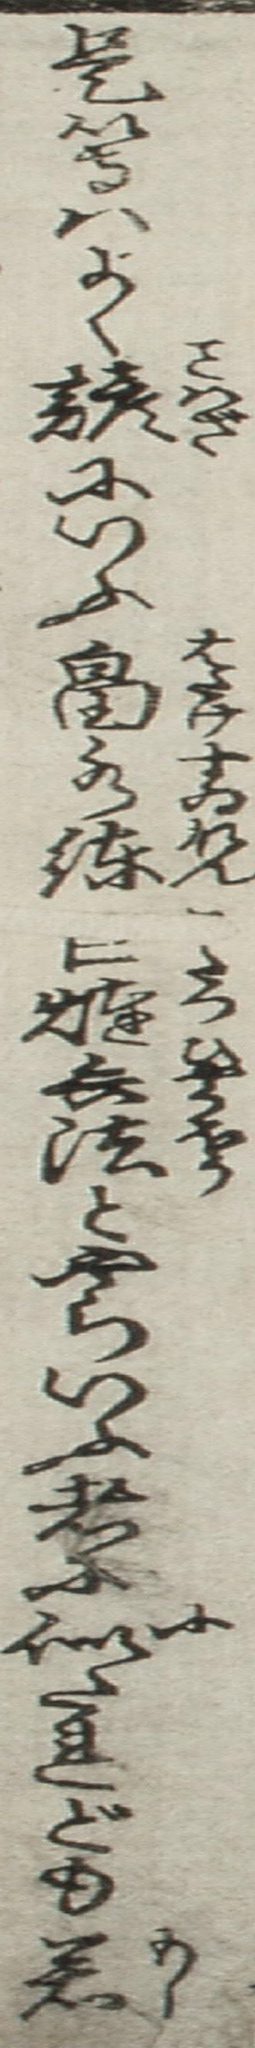是等はよく諺にいふ畑水練巨燵兵法とやらいふ者に似たれども若
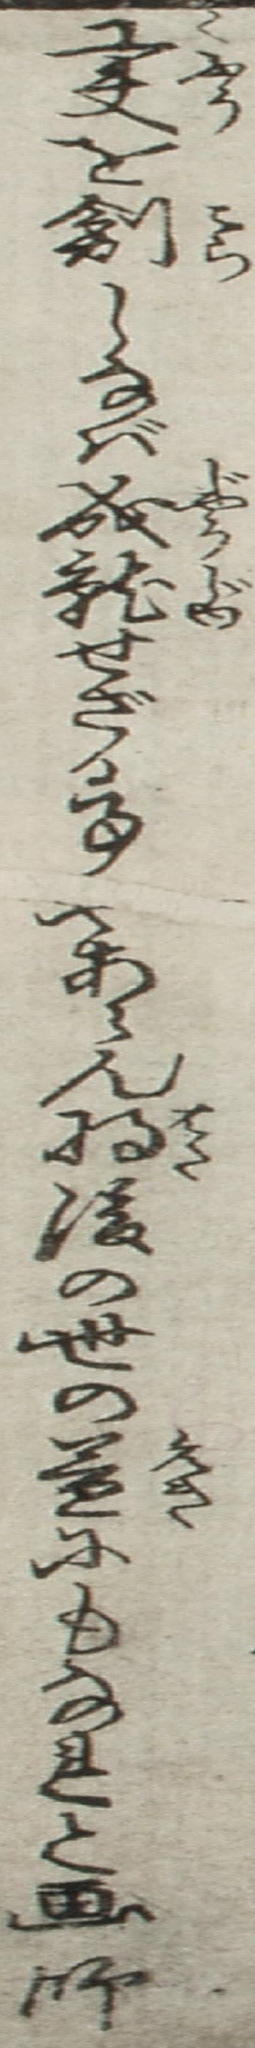工夫を創しなば成就せざる事やあらん将後の世の益にもなれと画師
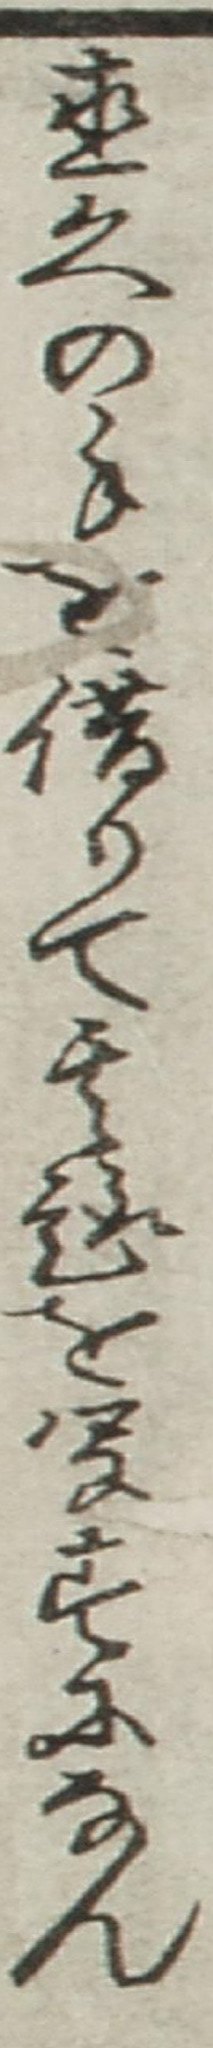直久の手を借りて其趣を写すになん

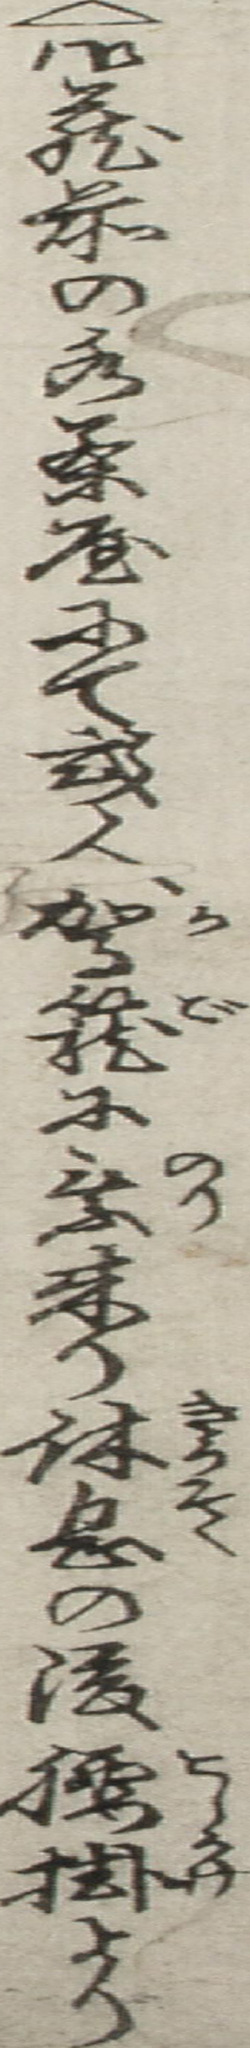△御蔵前の水茶屋にて或人駕籠に乗来り休息の後腰掛より
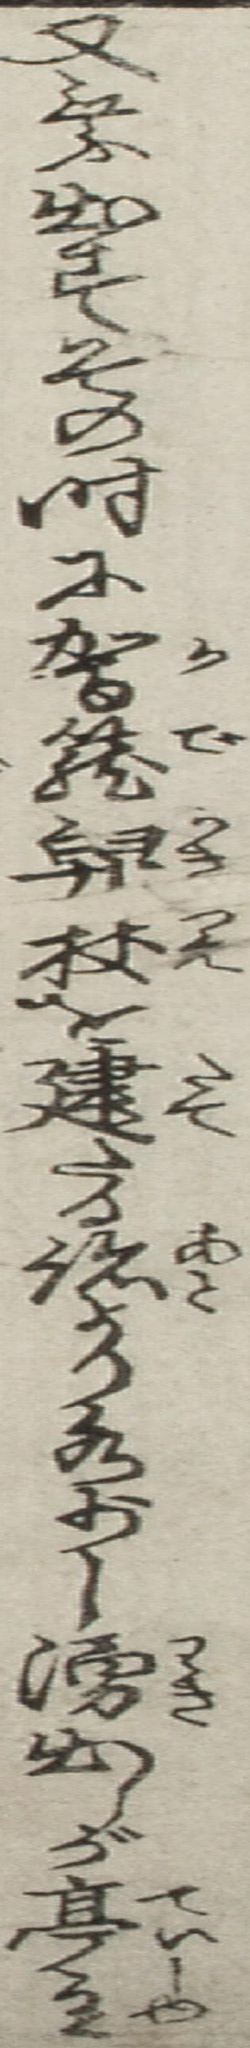又乗出すその時に駕籠舁杖を建たる跡より水少し湧出しが亭主
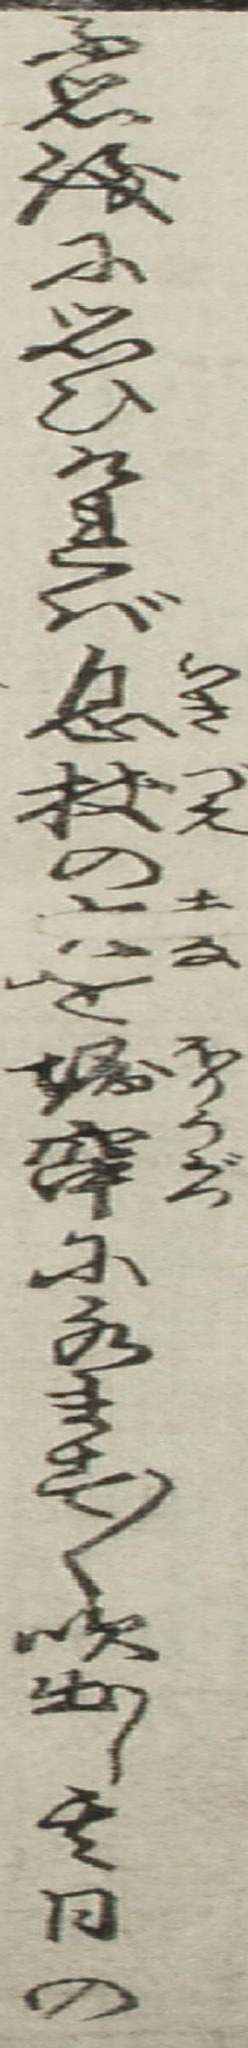不思議に思ひければ息杖の穴を掘穿に水ます〳〵吹出し其日の
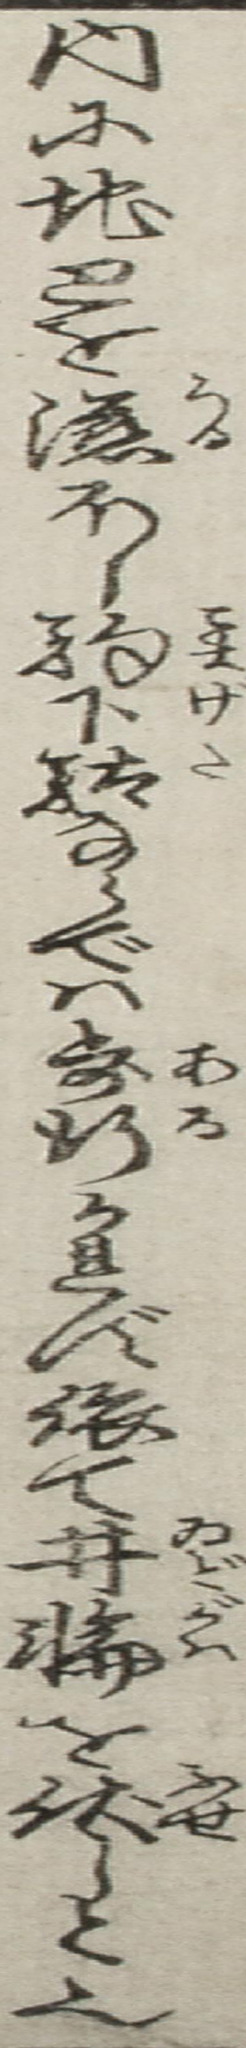内に地辺を湿ほし駒下駄ならでは歩行かれず依て井輪を伏しと也
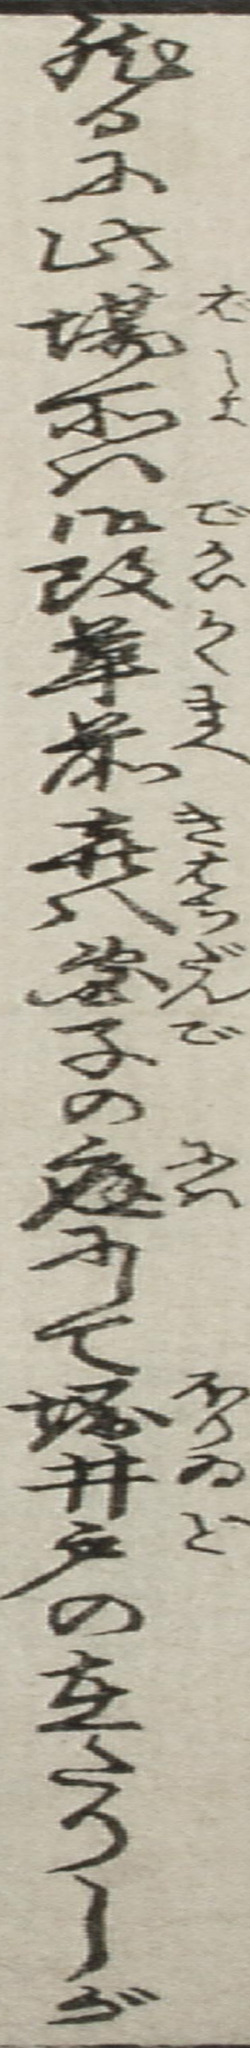然るに此場所は御改革前喜八団子の庭にて堀井戸の在たりしが
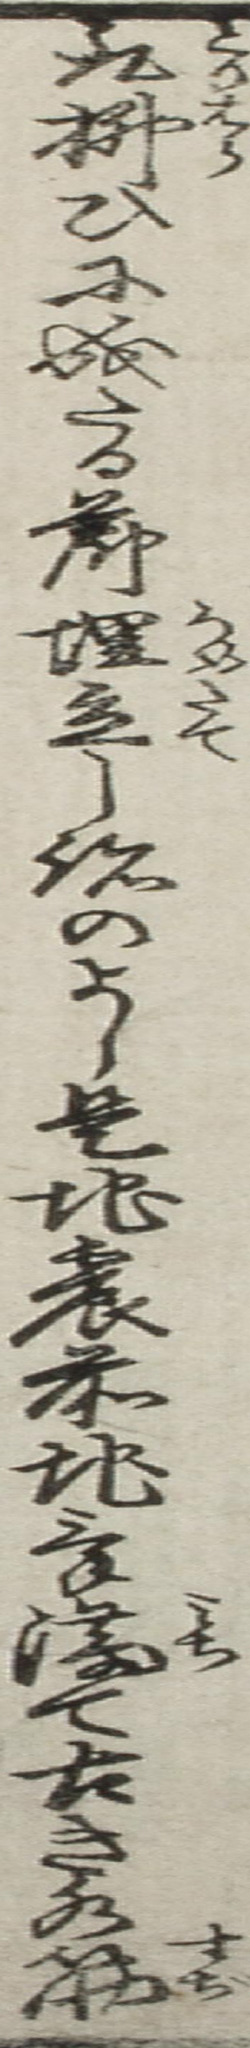取払ひに成たる節埋立し跡のよし是地震前地気満て古き水筋
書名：安政見聞誌　下
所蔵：東京大学地震研究所図書室 Earthquake Research Institute Library, The University of Tokyo, JAPAN
